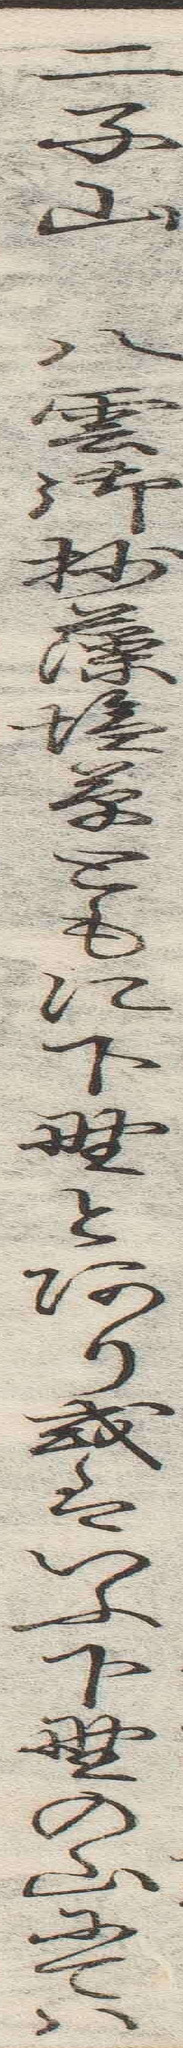二子山八雲御抄藻塩草ともに下㙒とあり或はいふ下㙒の山にては
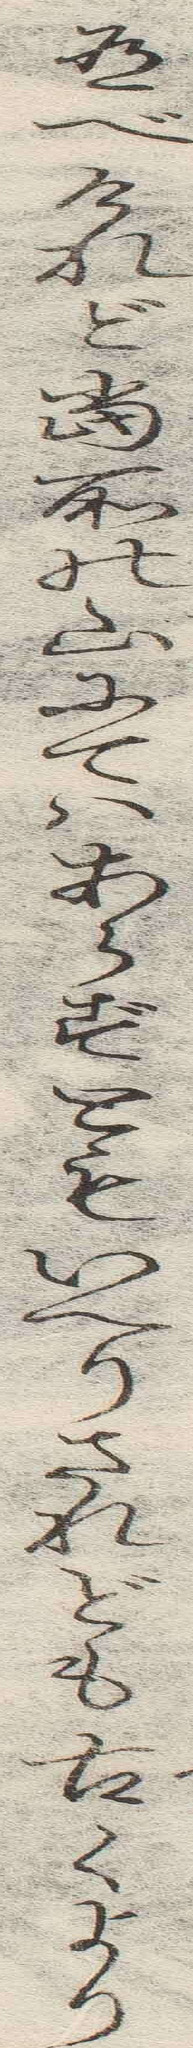有べけれど當所の山にてはあらずともいへりされども古くより
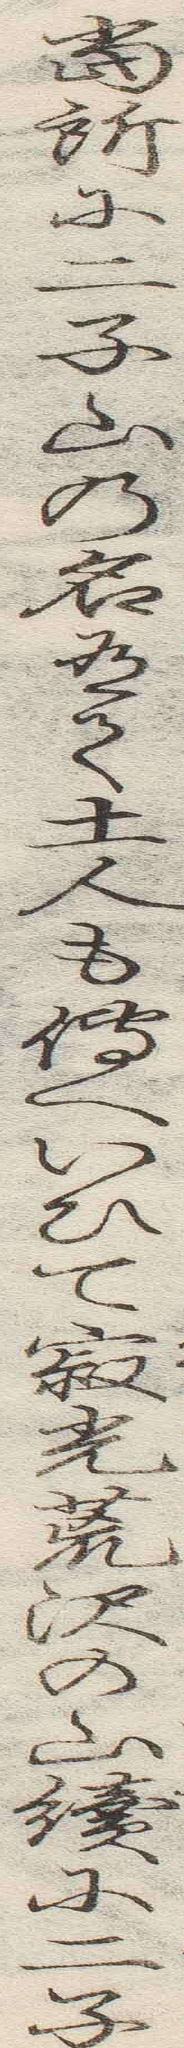當所に二子山の名有て土人も傳へいひて寂光荒沢の山續に二子
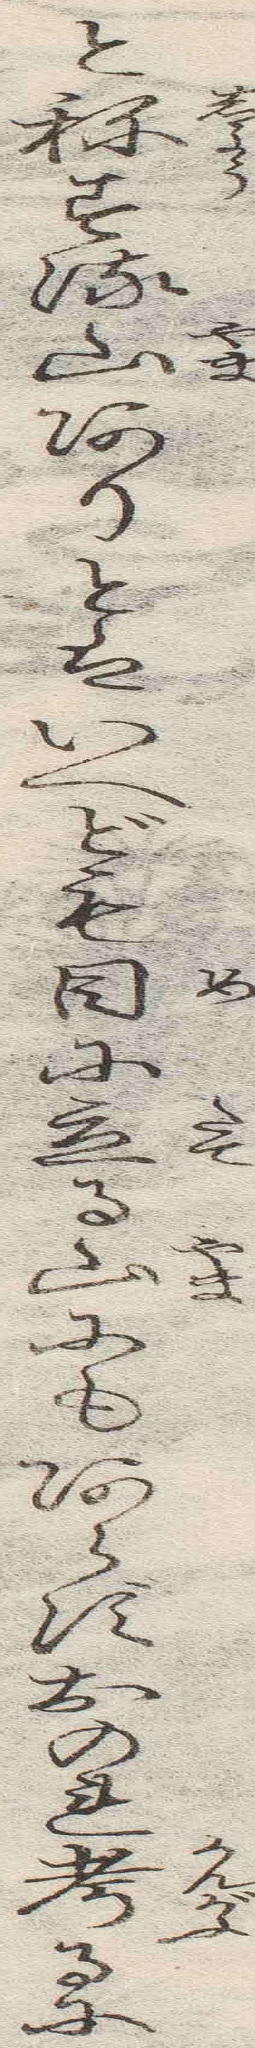と称する山ありとはいへども目に立る山にもあらずおのれ考るに
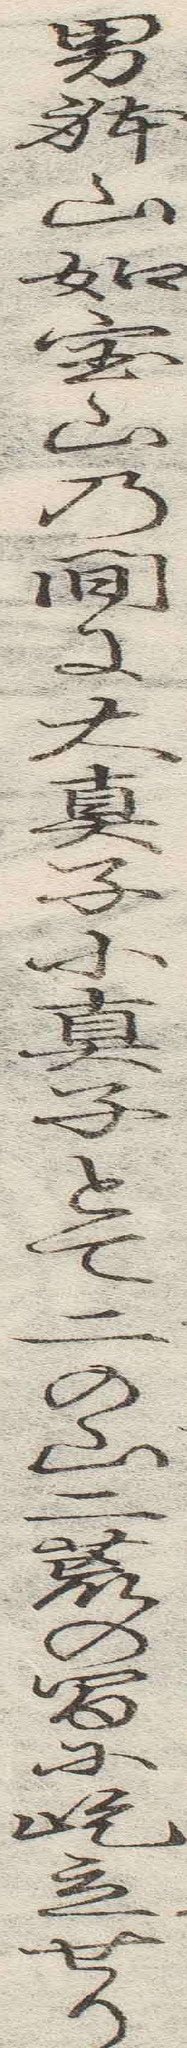男躰山如宝山の間に大真子小真子とて二の山二荒の間に屹立せり
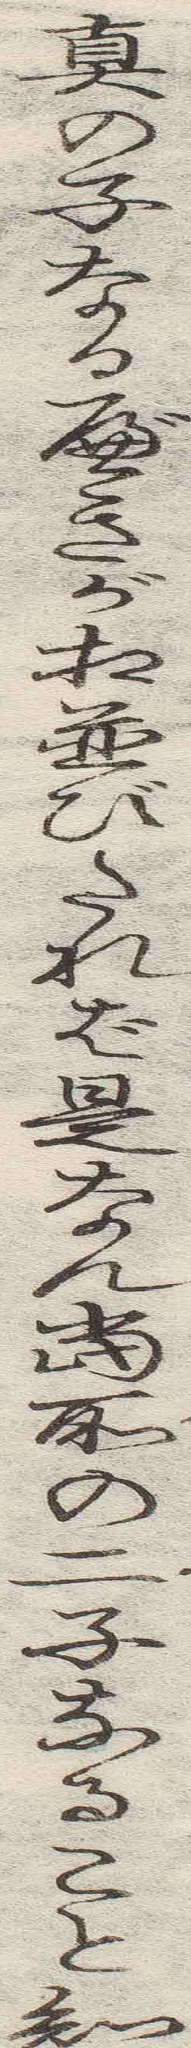真の子なるべきが相並びたれば是なん當所の二子なること知
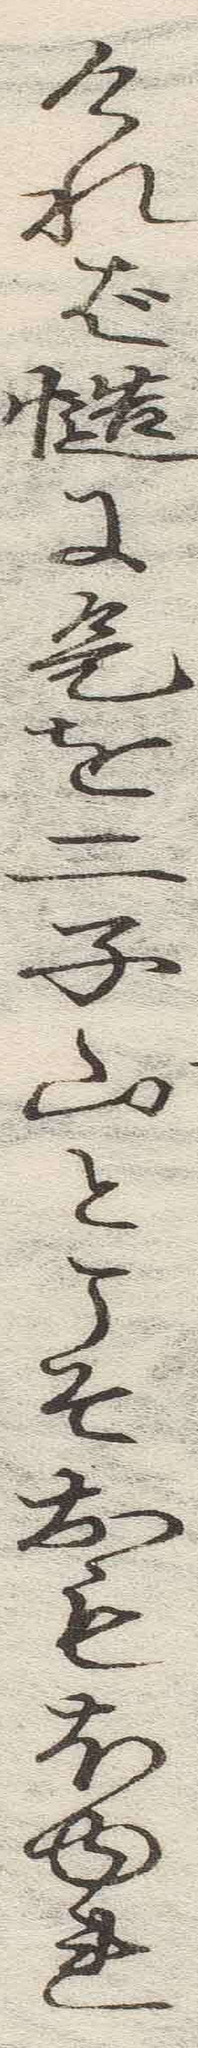ければ慥に是を二子山とこそおもほゆれ
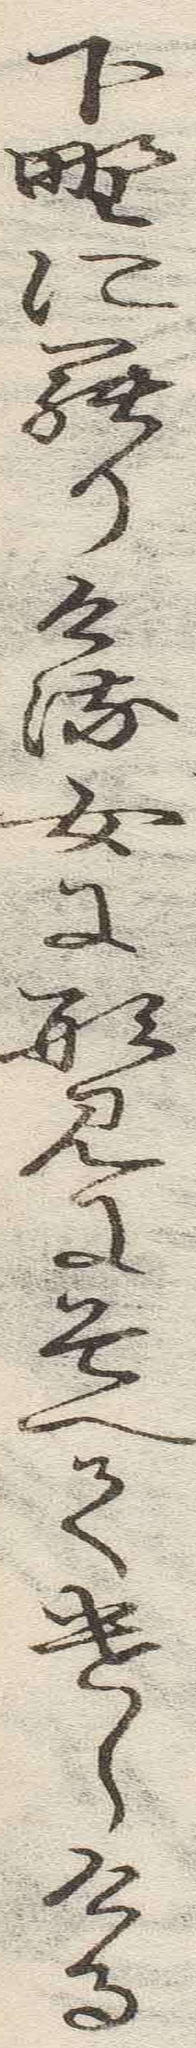下㙒に罷りける女に形見にそへて遣しける
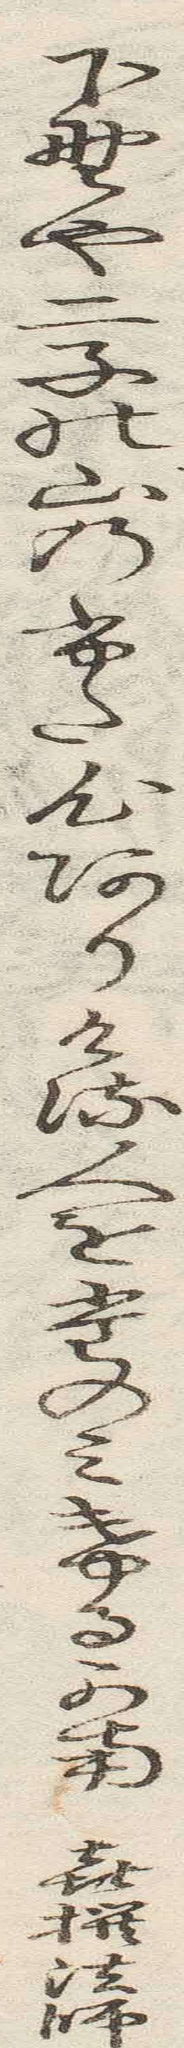六帖下㙒や二子の山のふた心ありける人をたのみけるかな喜撰法師
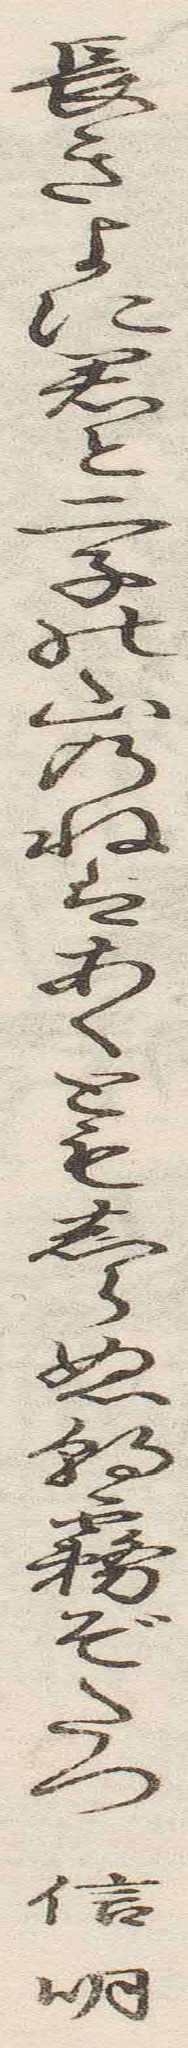家集長きよに君と二子の山のねはあくともしらぬ朝霧ぞたつ信明
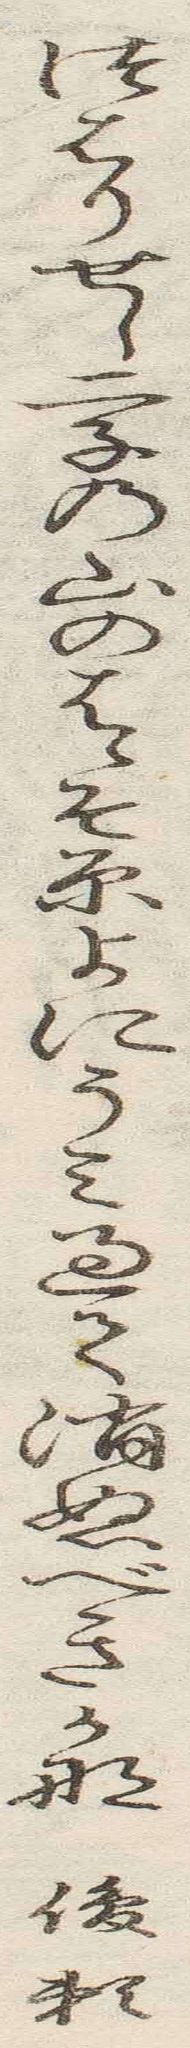名寄つはりせし二子の山のはゝそ原よにうみ過て消ぬべきかな後頼
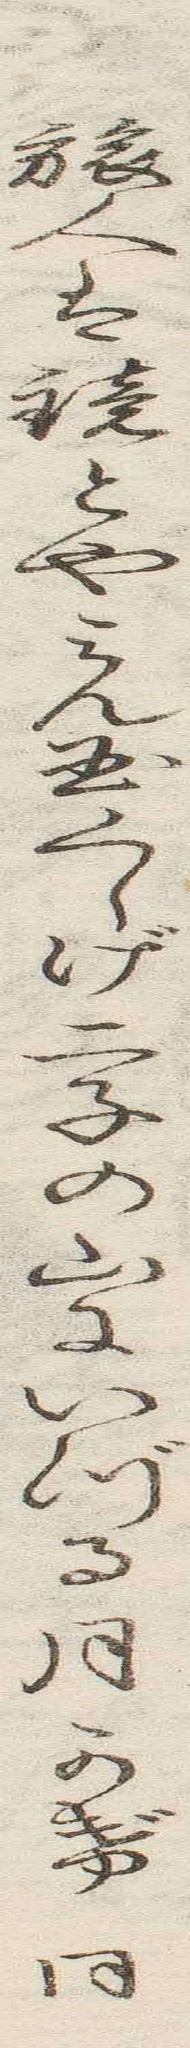同旅人は鏡とやみん玉くしげ二子の山にいづる月かげ同
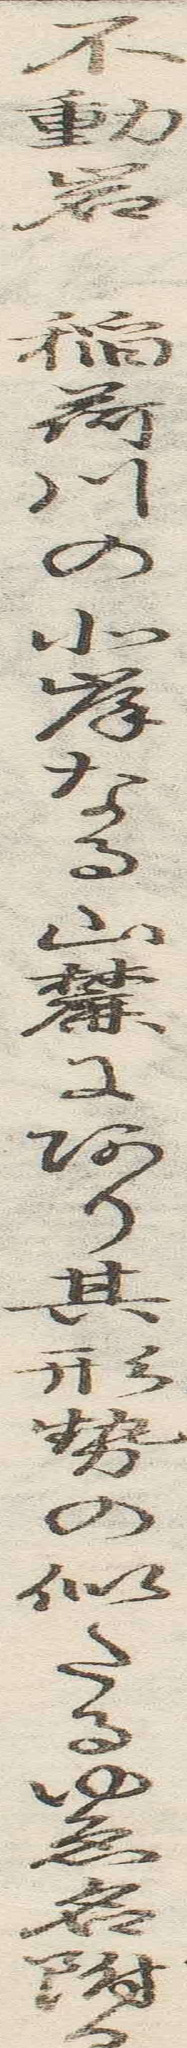不動岩稲荷川の北岸なる山麓にあり其形㔟の似たるゆゑ名附る
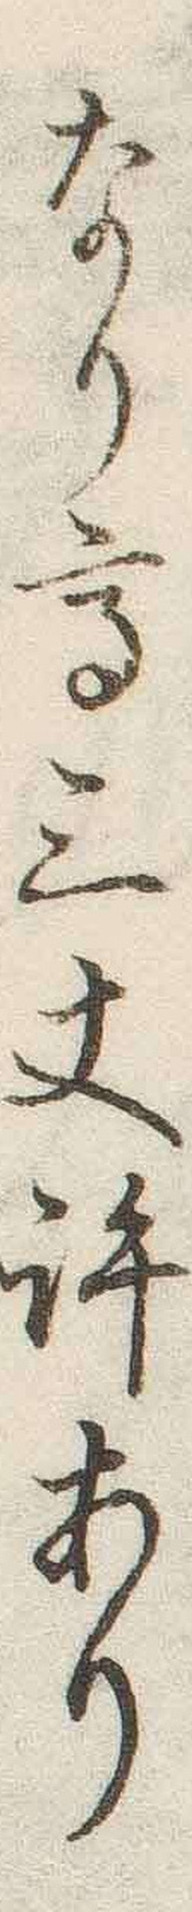なり高三丈許あり
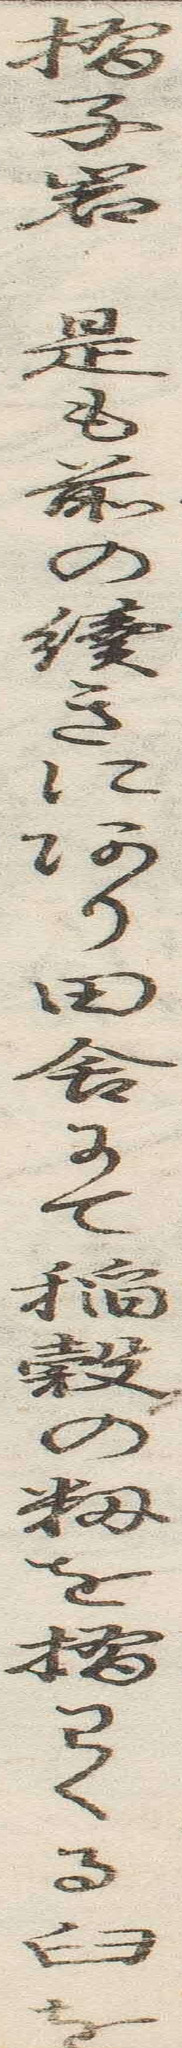摺子岩是も前の續きにあり田舎にて稲穀の籾を摺わくる臼を
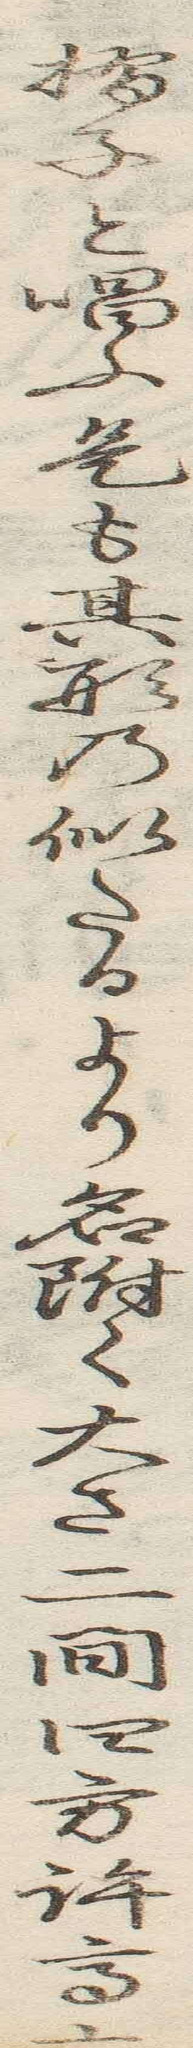摺子と唱ふ是も其形の似たるより名附く大さ二間四方許高六
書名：日光山志
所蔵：東京学芸大学附属図書館 国文学研究資料館
